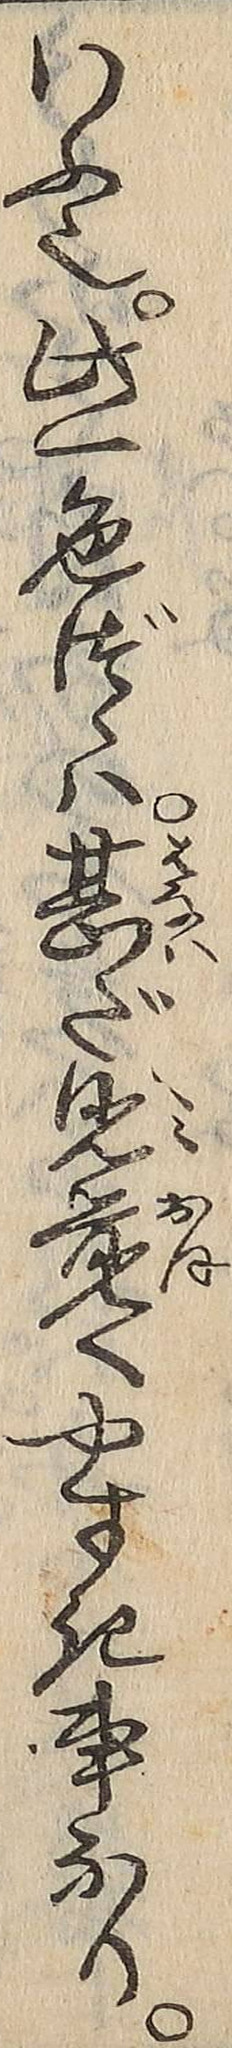いふ也。此一色づゝは。甚だ見覚へやすき事なり。
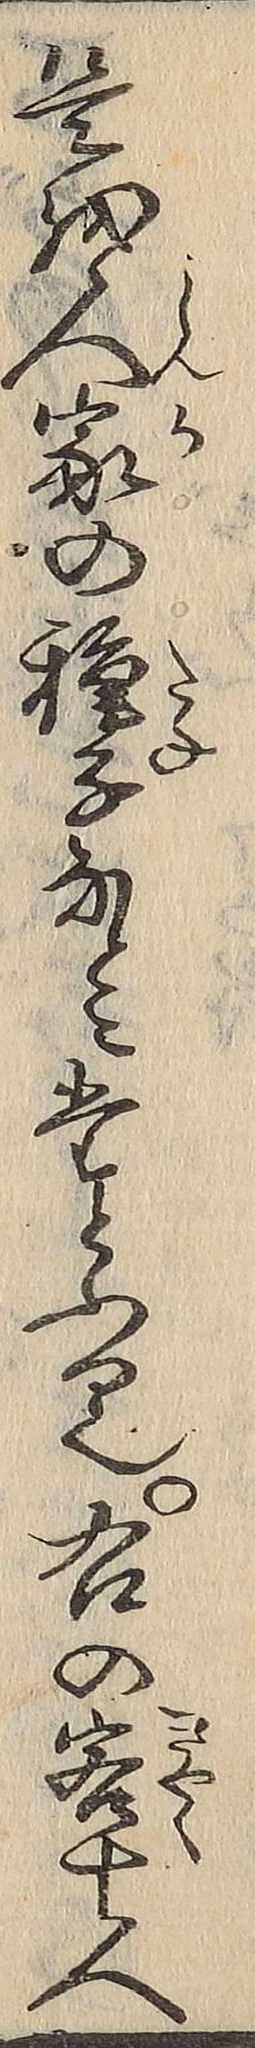是を人家の種子なとにたとふる也。右の客十人
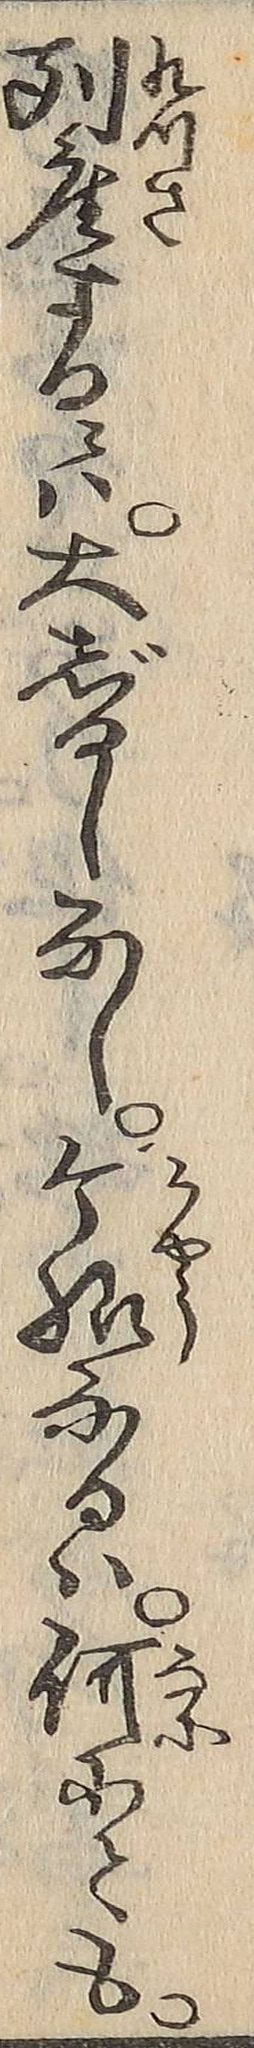列座するには。大じるしなし。ケ様なるは。何にても。
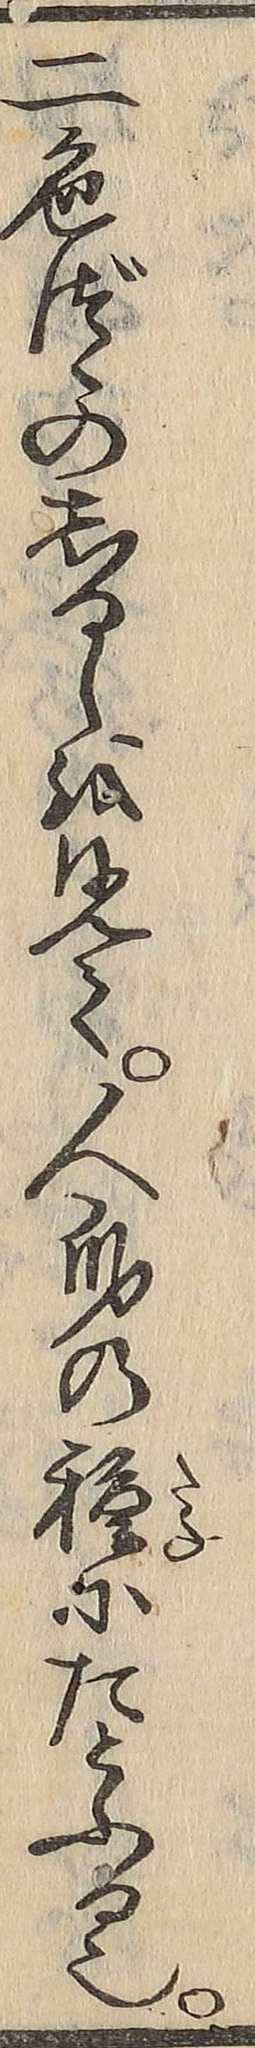二色づゝのしるしを見て。人身の種にたとふる也。
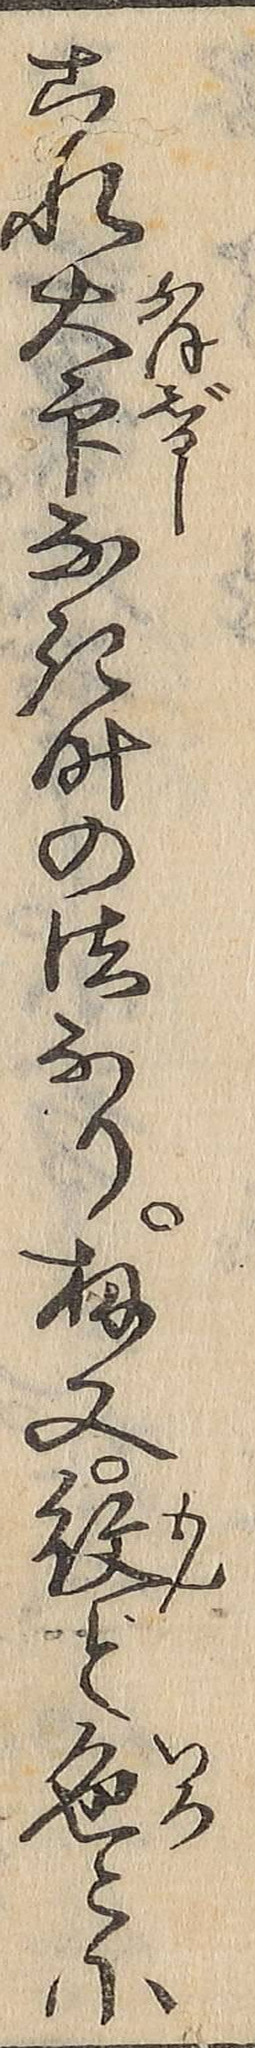これ大印なき時の法なり。扨又。紋と色とに
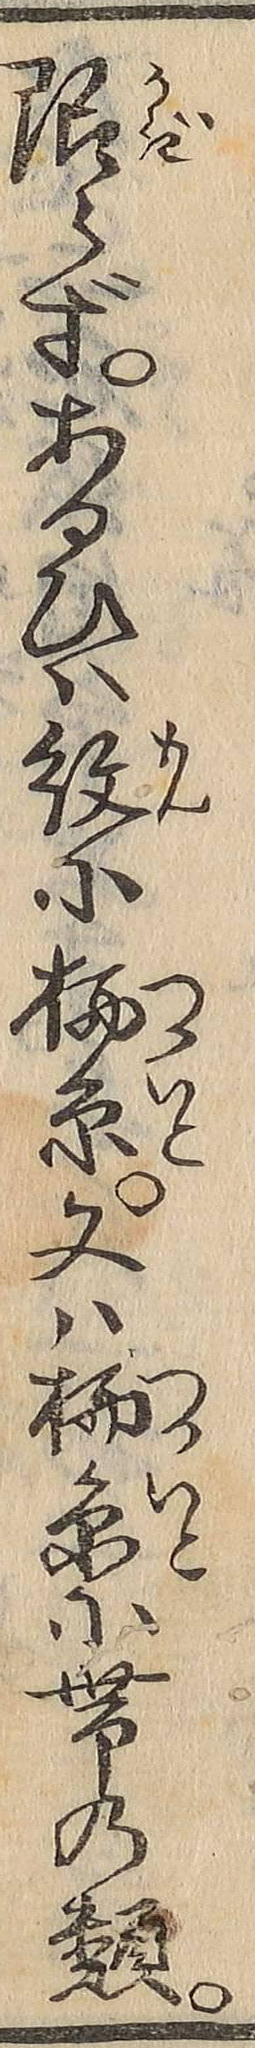限らず。あるひは紋に柄糸。又は柄糸に帯の類。
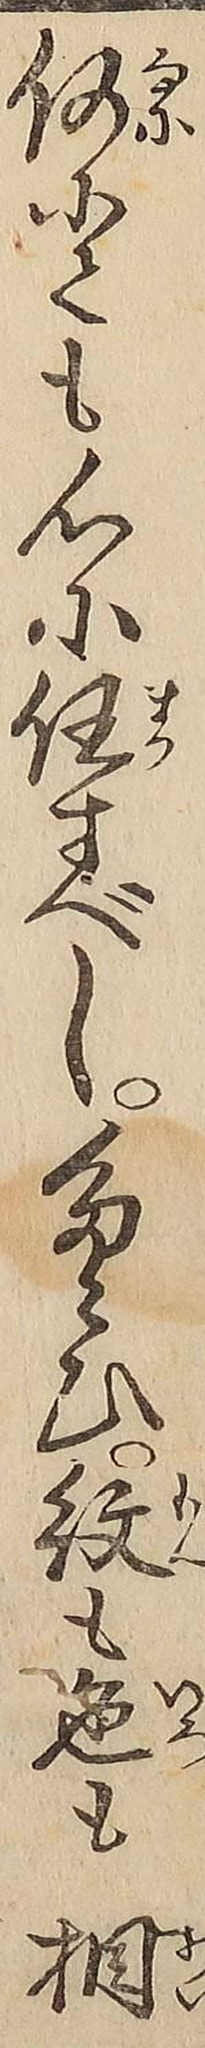何にても心に任すべし。たとひ。紋も色も相
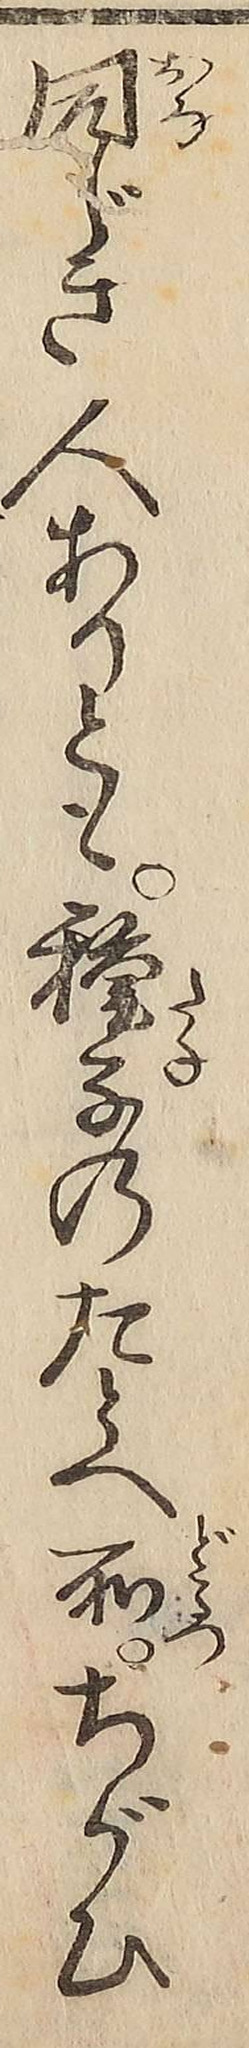同じき人ありとも。種子のたとへ所。ちがひ
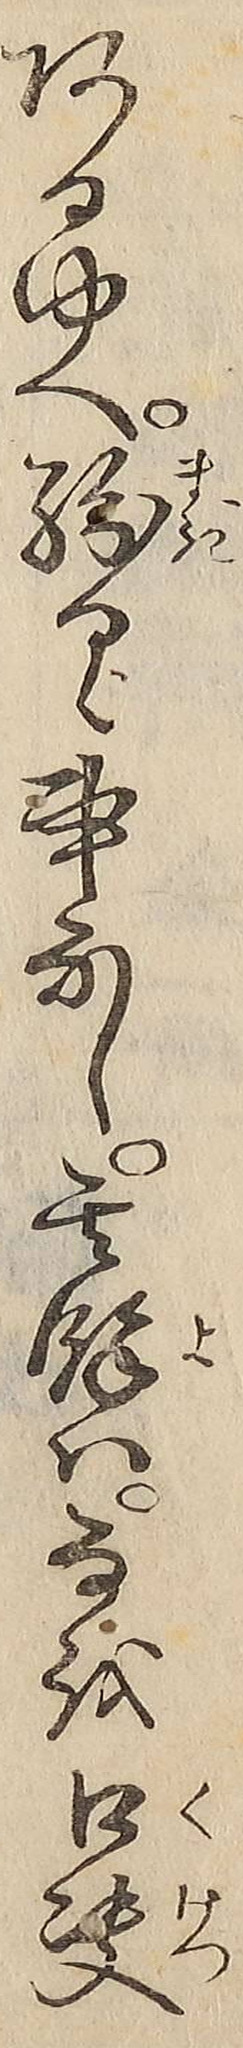あるゆへ。紛るゝ事なし。其餘は。なを口決
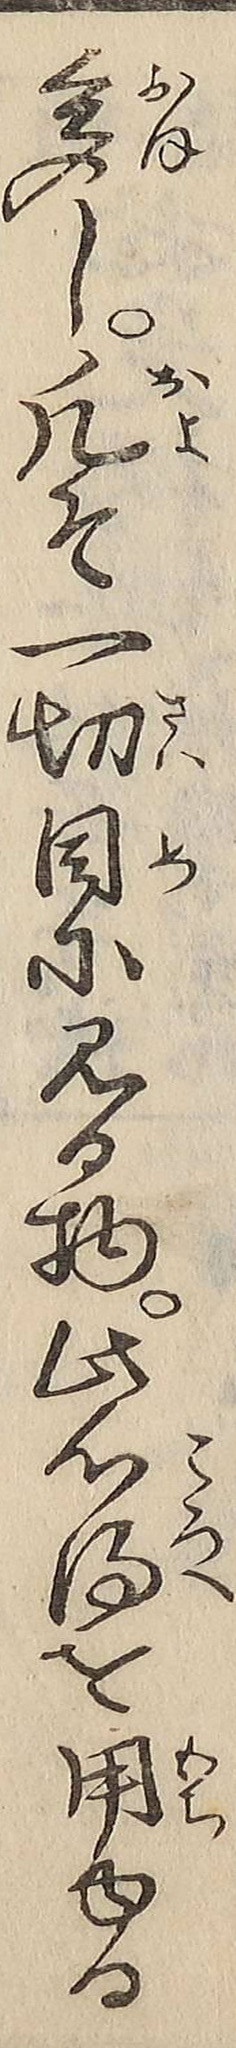多し。凡そ一切目に見る物。此心得を用ゆる
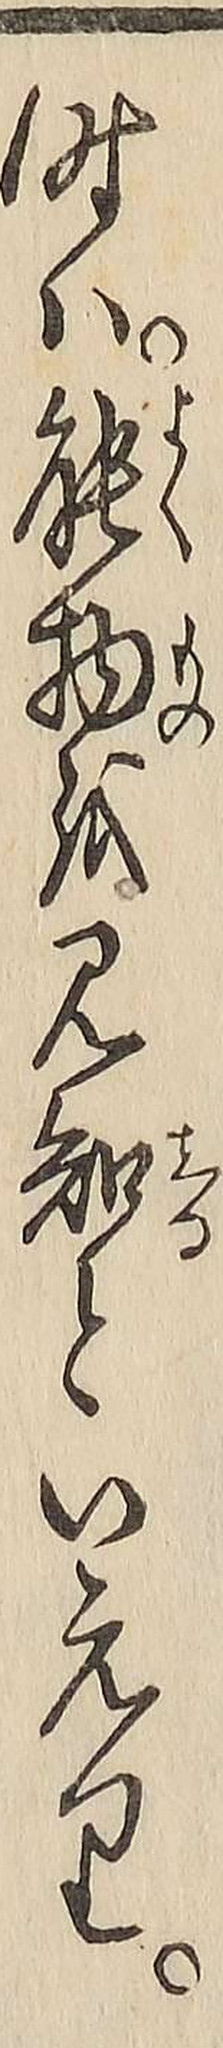時は。能物を見知といえり。
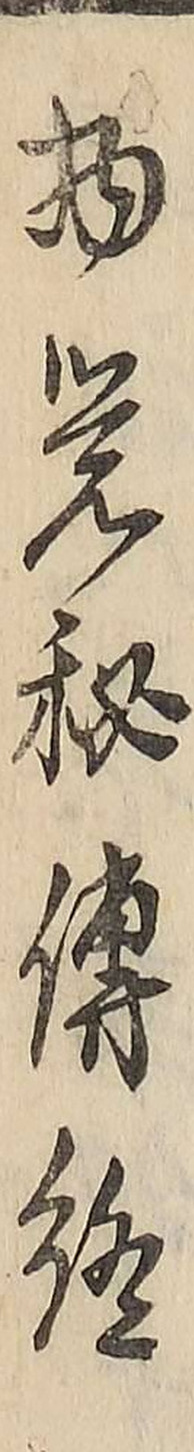物覚秘伝終

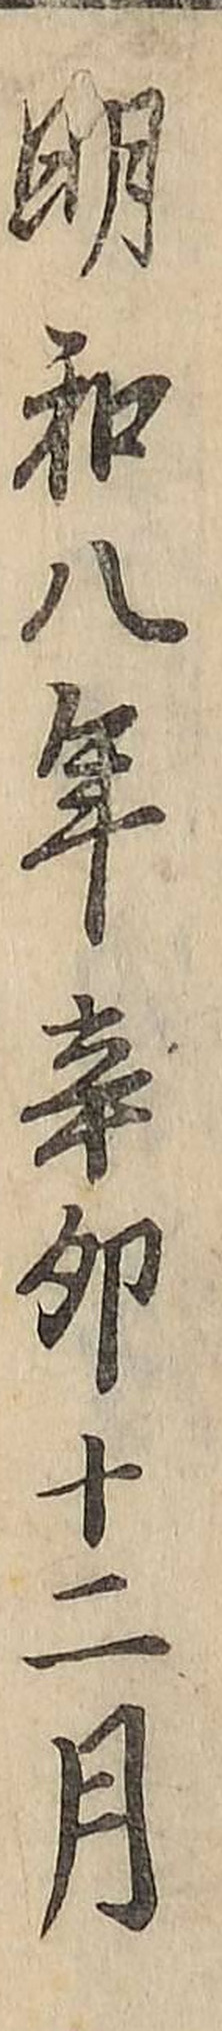明和八年辛卯十二月
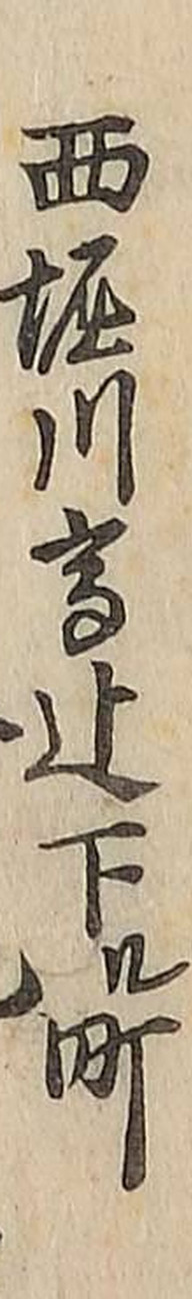西堀川高辻下ル町
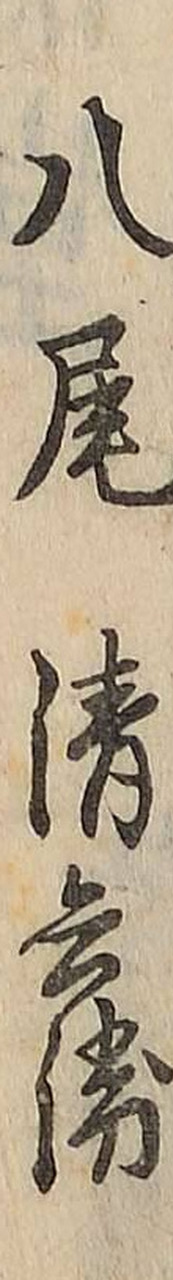八尾清兵衛
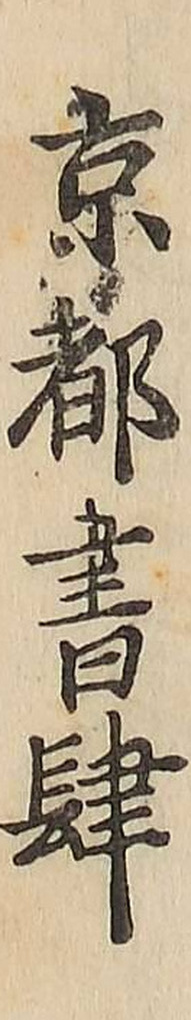京都書肆
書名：物覺秘傳
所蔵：神戸大学附属図書館 国文学研究資料館
